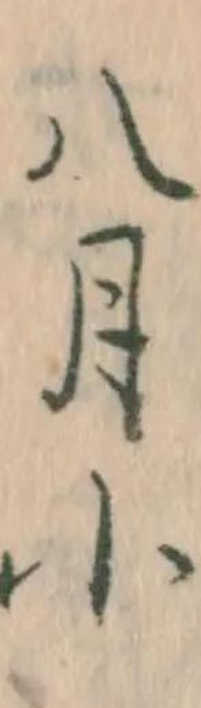八月小
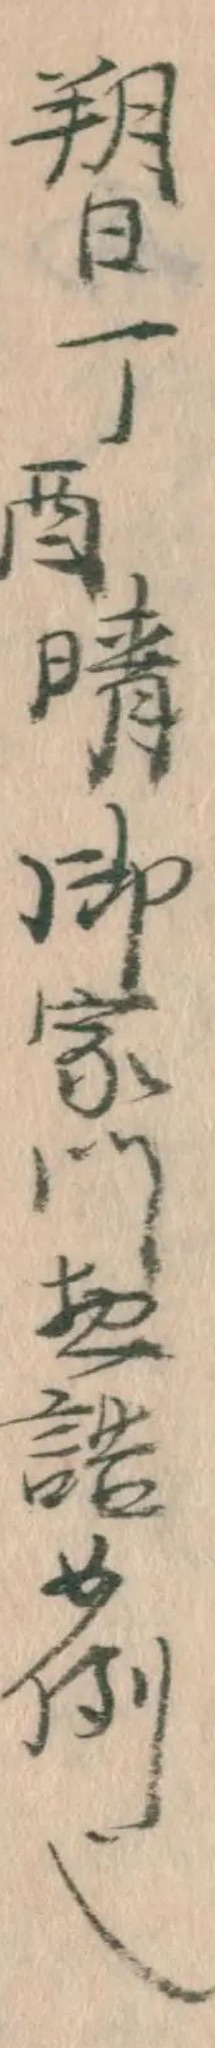朔日丁酉晴御家門惣詰如例也
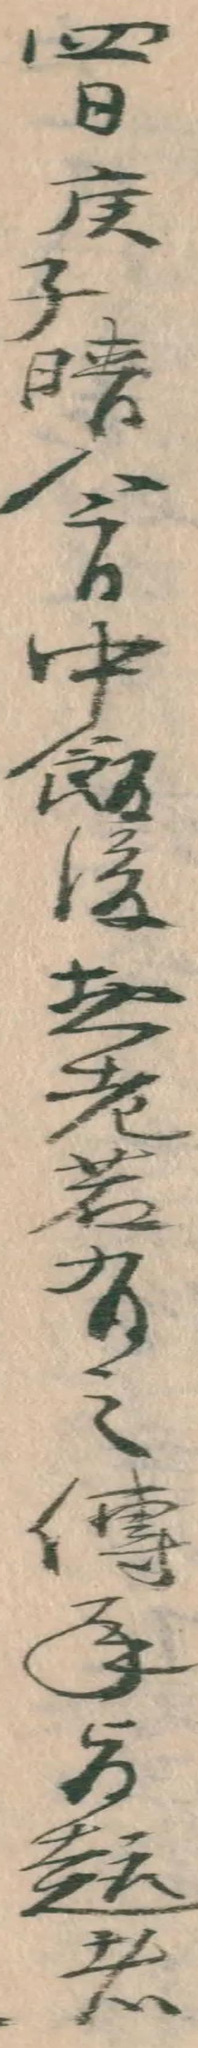四日庚子晴今日中飯後惣老若有之伝承旨趣者
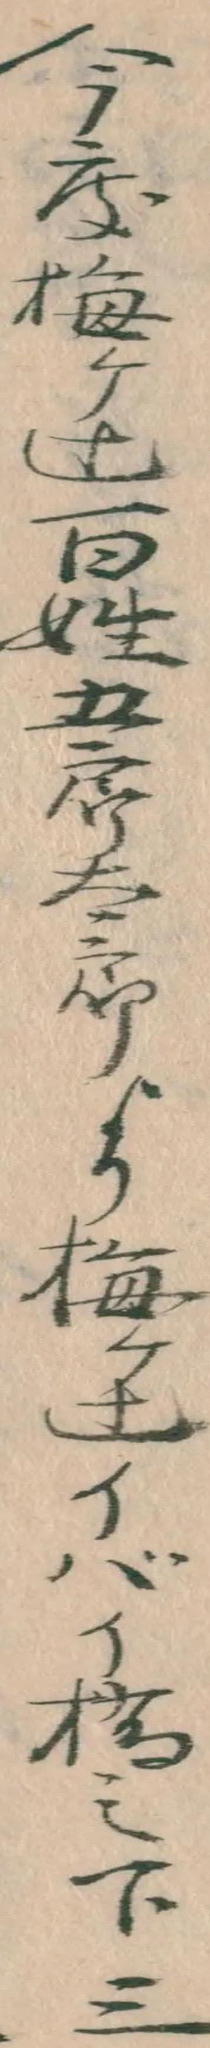今度梅ヶ辻百姓五郎太郎より梅ヶ辻イバイ橋之下三
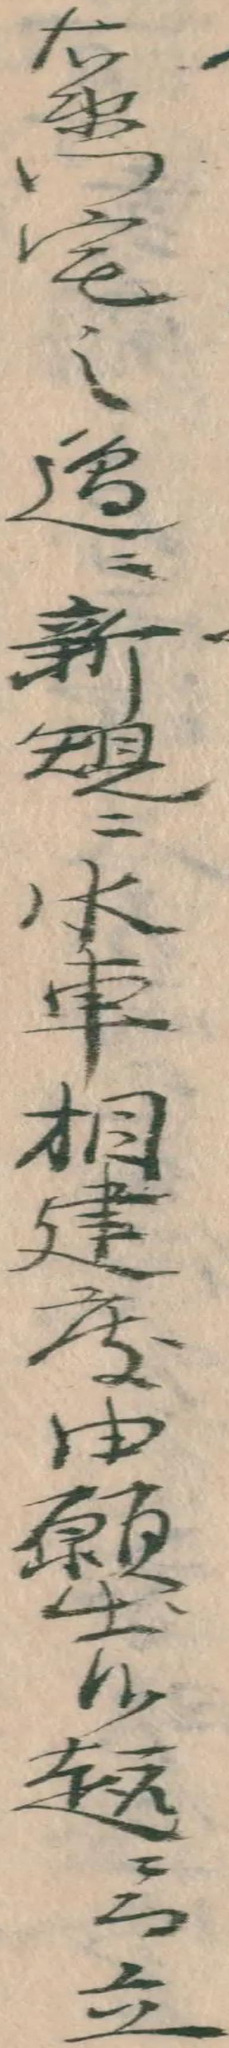右衛門宅之辺に新規に水車相建度由願出候趣にて立
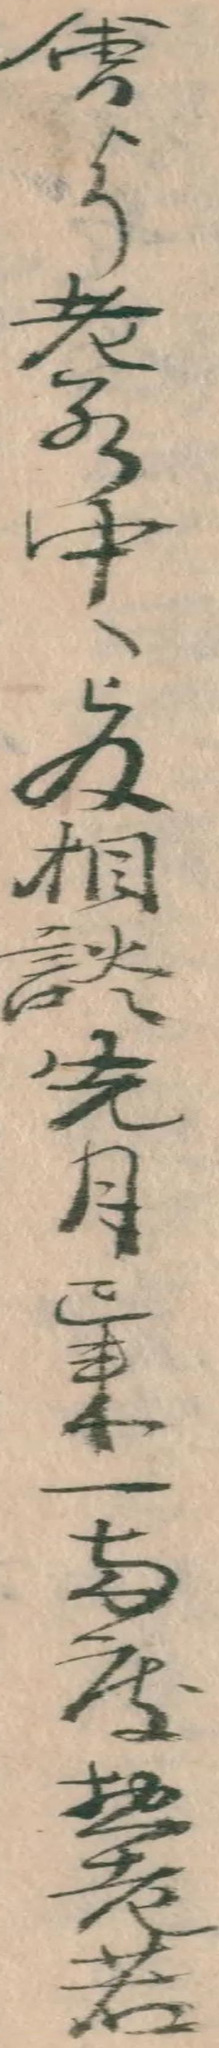会より老若中へ被及相談先月已来一両度惣老若
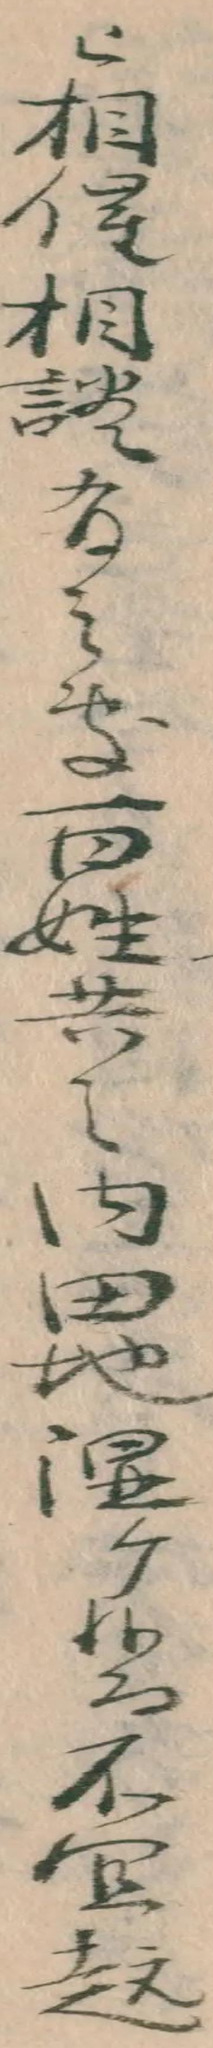被相催相談有之処百姓共之内田地湿ケ候而不宜趣
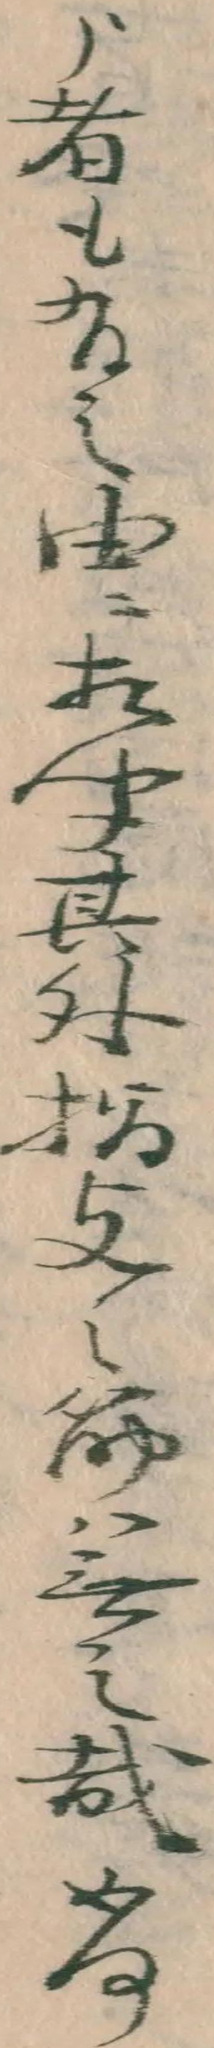申者も有之由に相聞其外指支之筋は無之哉如何
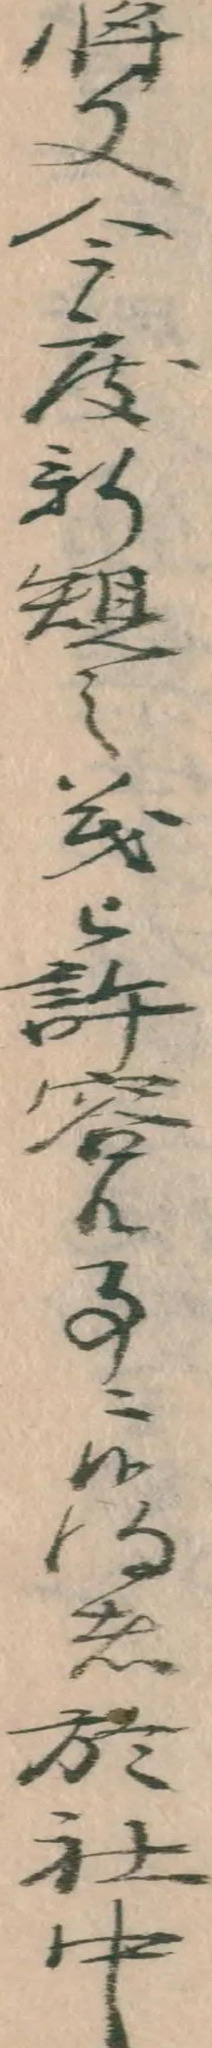将又今度新規之義被許容候事に候得は於社中
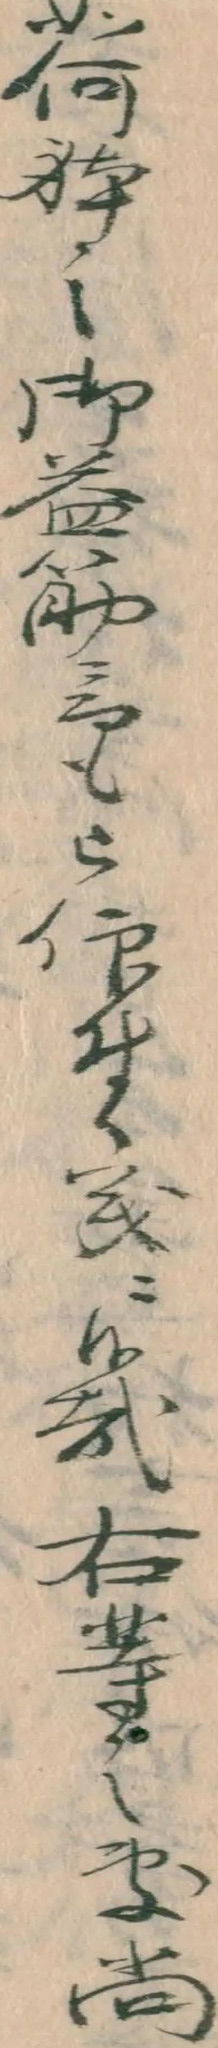如何躰之御益筋ニ而も被仰付候義ニ候哉右等之処尚
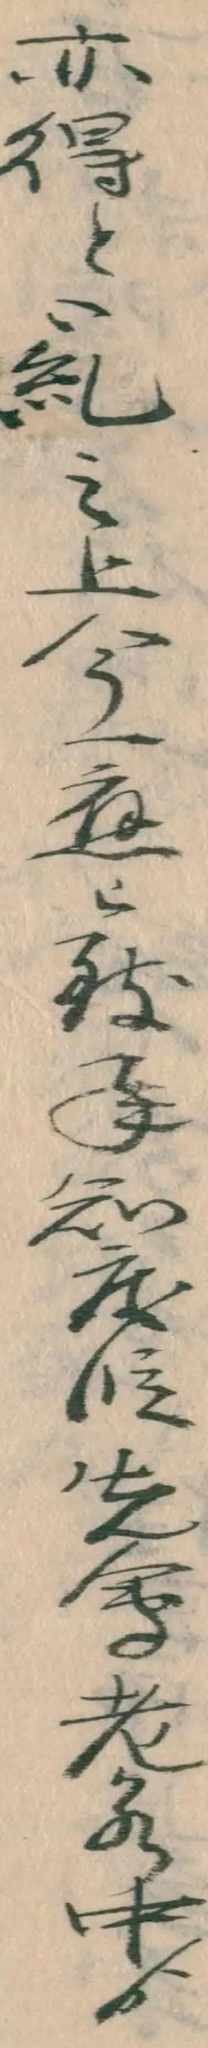亦得と御糺之上今一応被致承知度段先会老若中ゟ
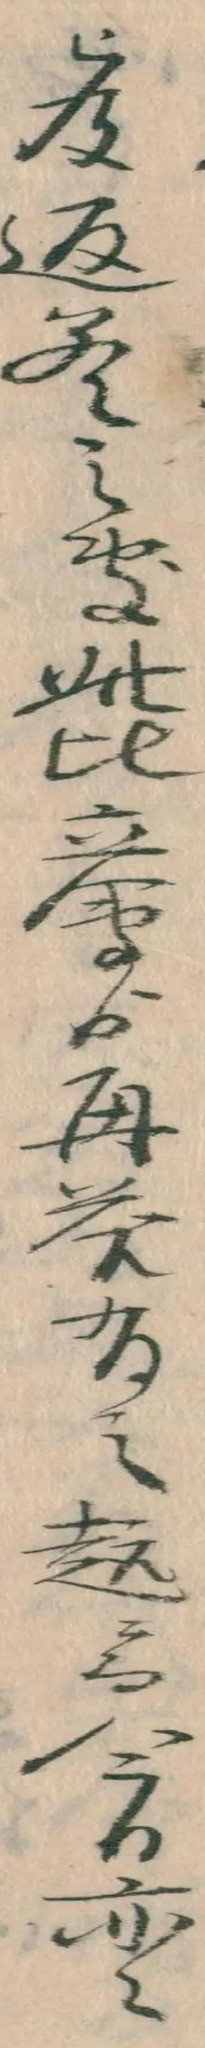被及返答之処此比立会ゟ再答有之趣ニ而今日亦々
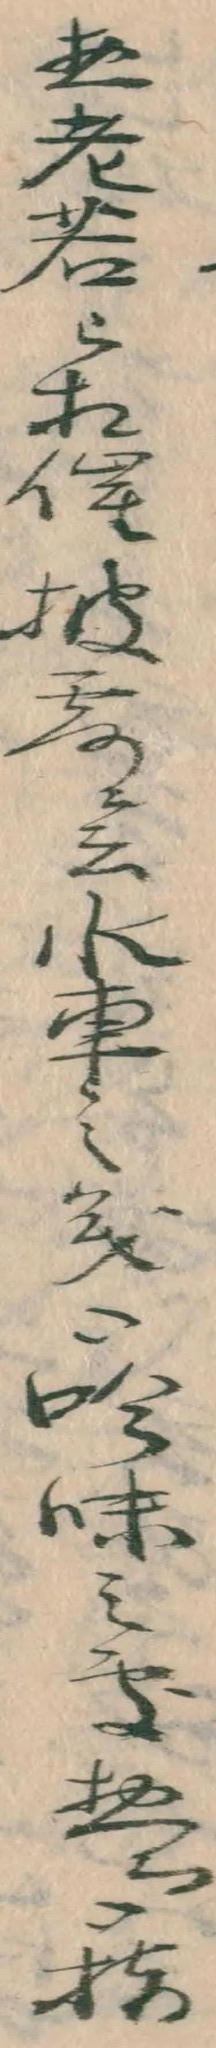惣老若被相催披露ニ云水車之義御吟味之処惣而御指
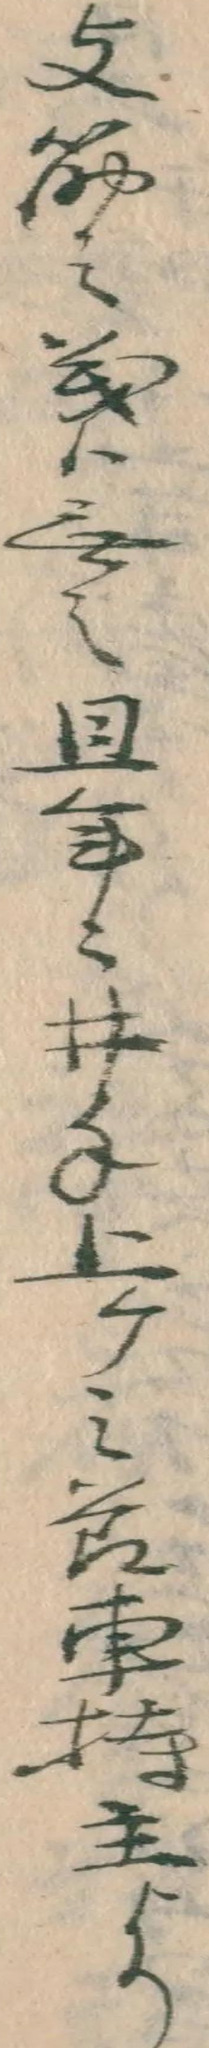支筋之義ハ無之且年々井手上ケ之節車持主より
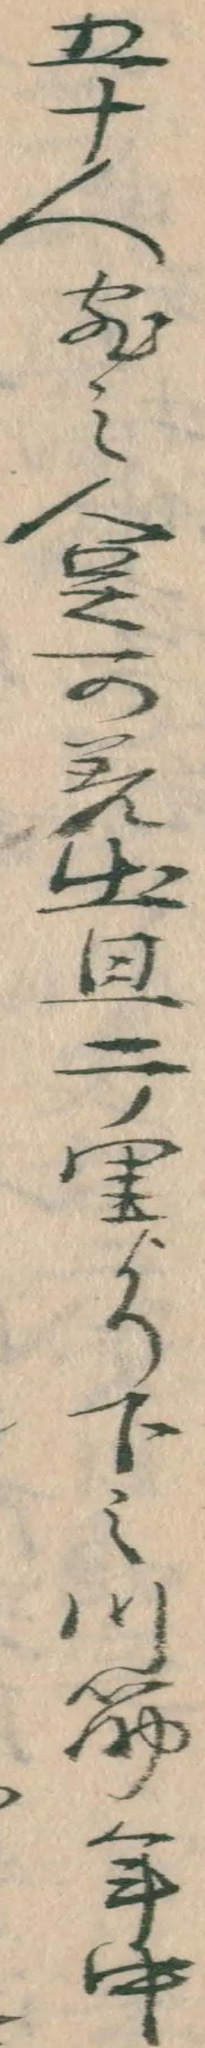五十人宛之人足可差出且二ノ里より下之川筋年中
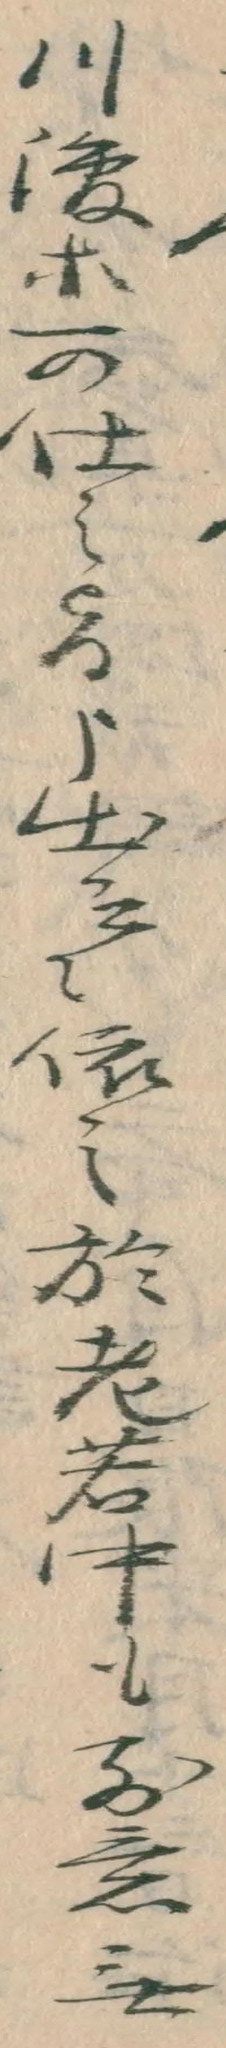川浚等可仕之旨申出云々依之於老若中も別意無
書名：賀茂社記録. 第64冊
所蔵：国立国会図書館 National Diet Library, JAPAN
